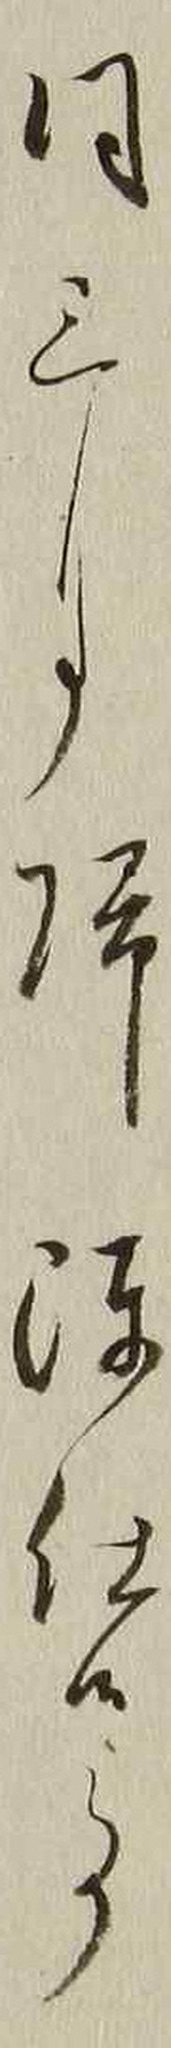同三月帰陣仕候事
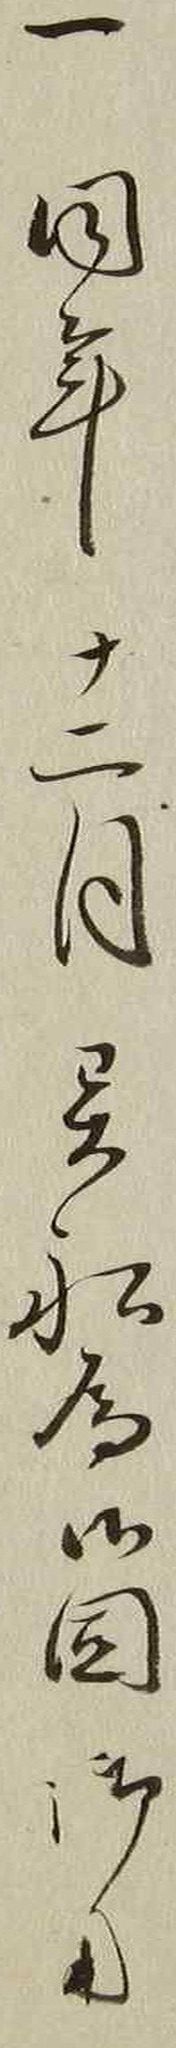一同年十二月異船為御固御用
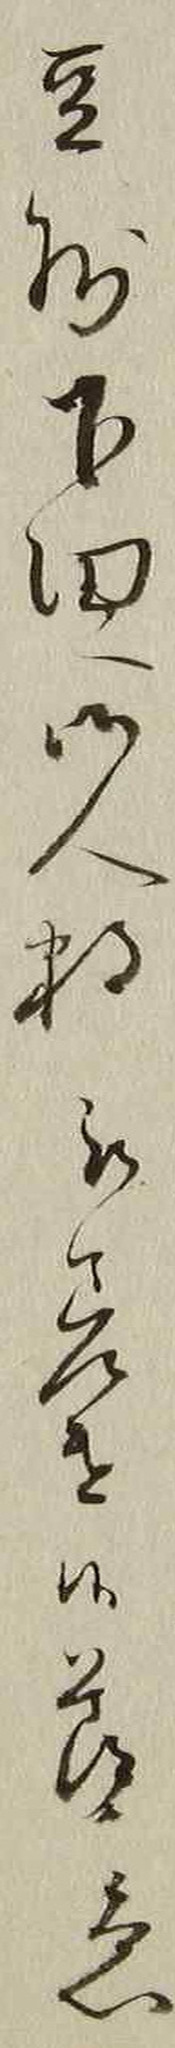豆州下田へ御人数被差遣候節急
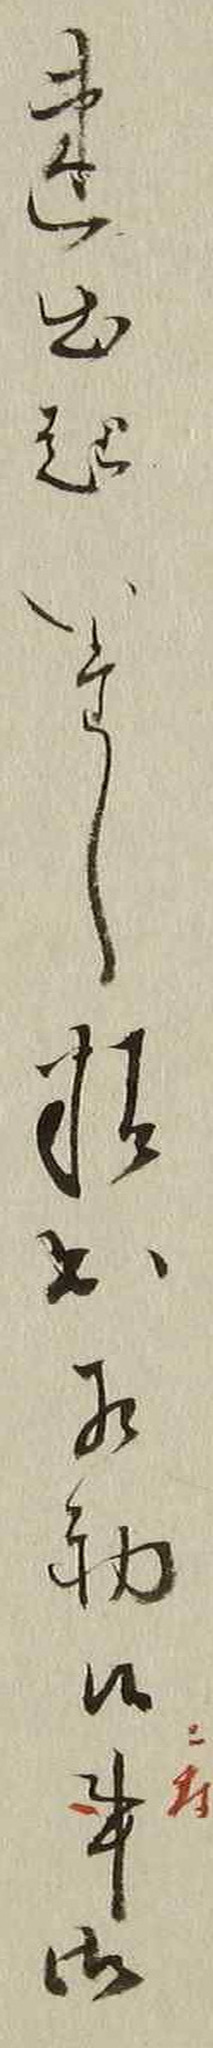速出起いたし精出相勤候ニ付御
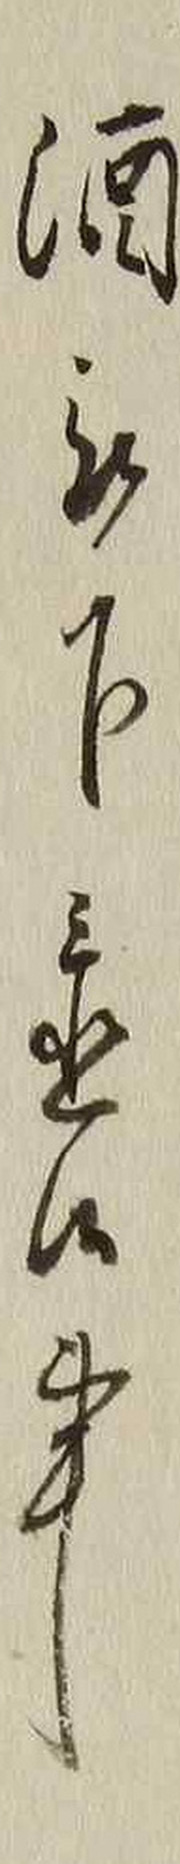酒被下置候事
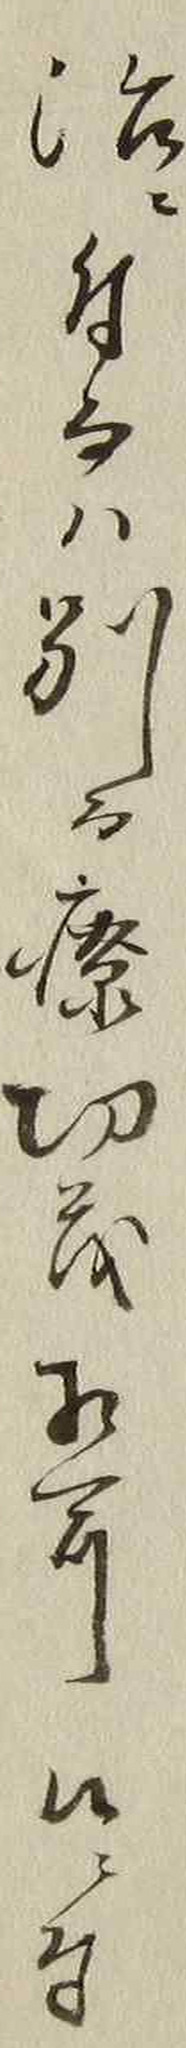始ニ付而ハ別而療功も相聞候ニ付
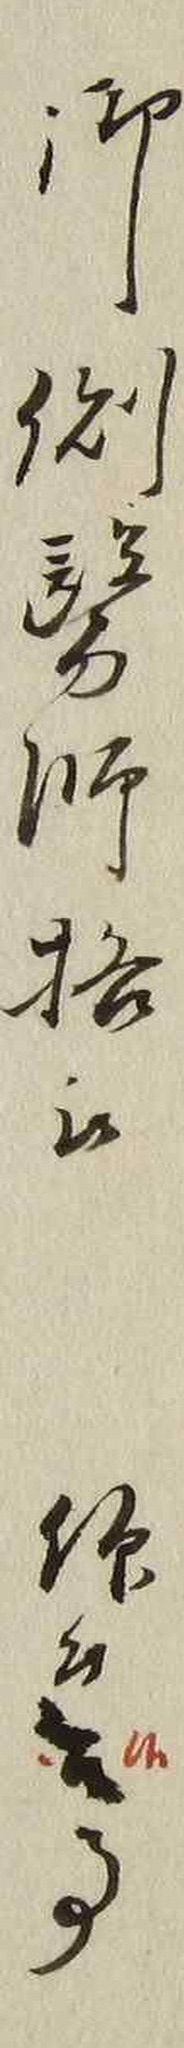御側医師格被仰付候事
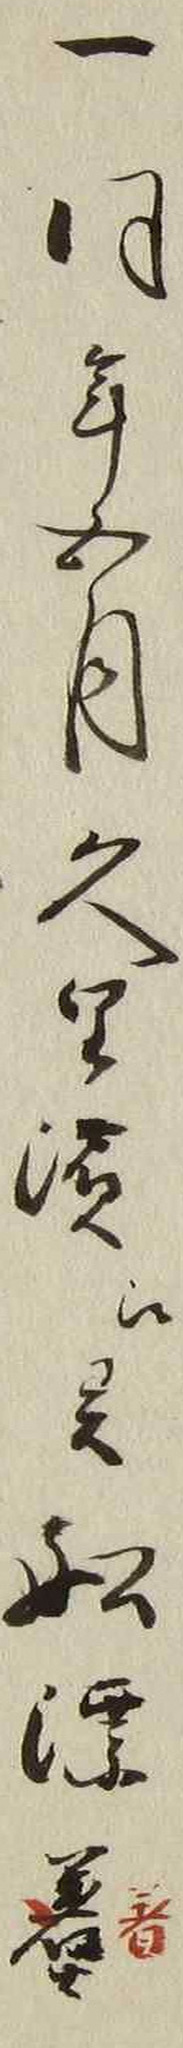一同年五月久里浜江異船漂着
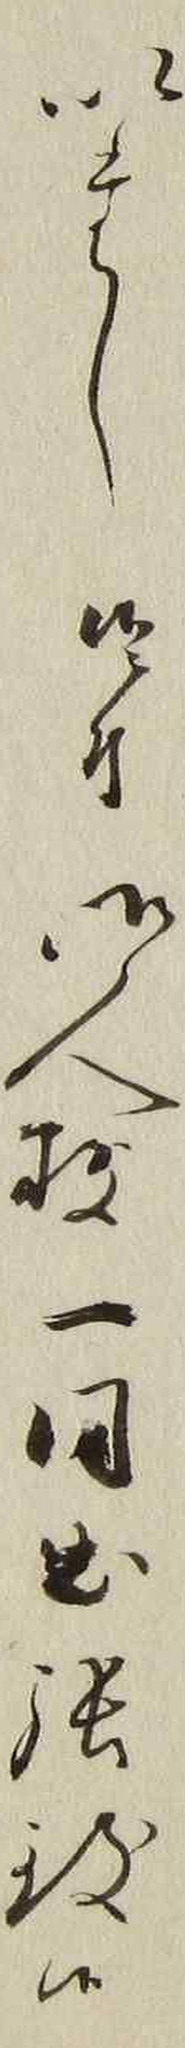いたし候ニ付御人数一同出張致御
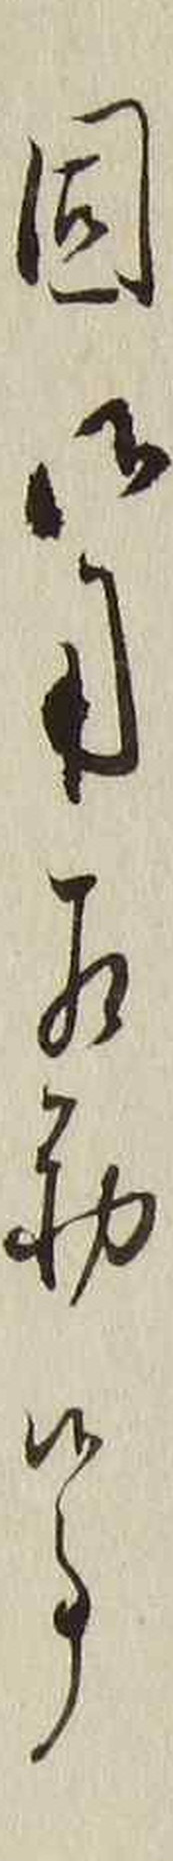固御用相勤候事
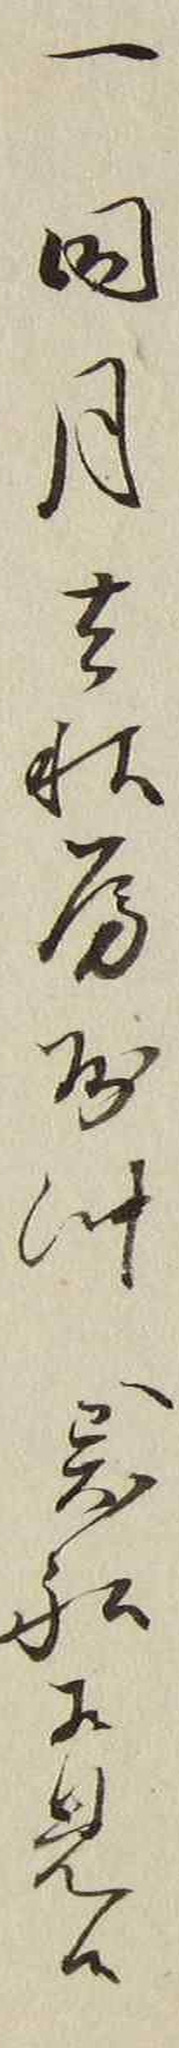一同月去秋房州沖へ異船相見候
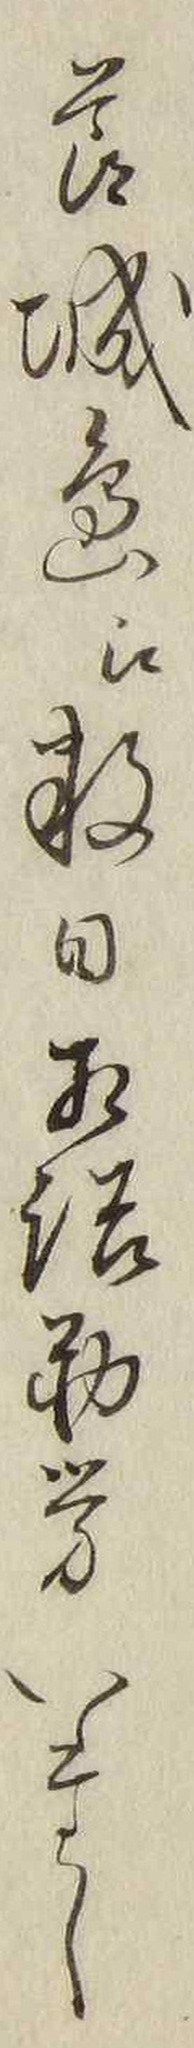節城嶋江被数日相詰勤労いたし
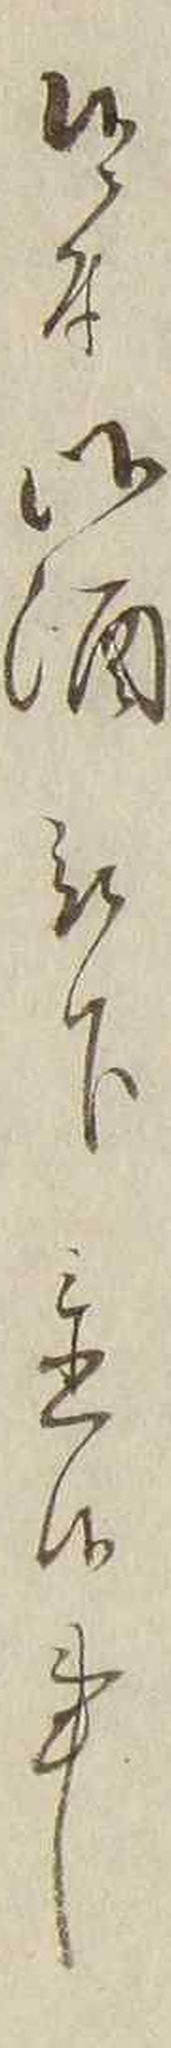候ニ付御酒被下置候事

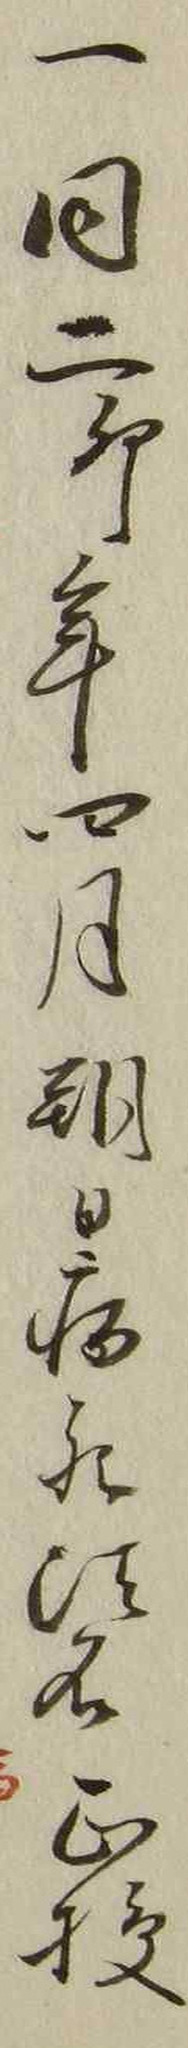一同二卯年四月朔日病死法名正挍
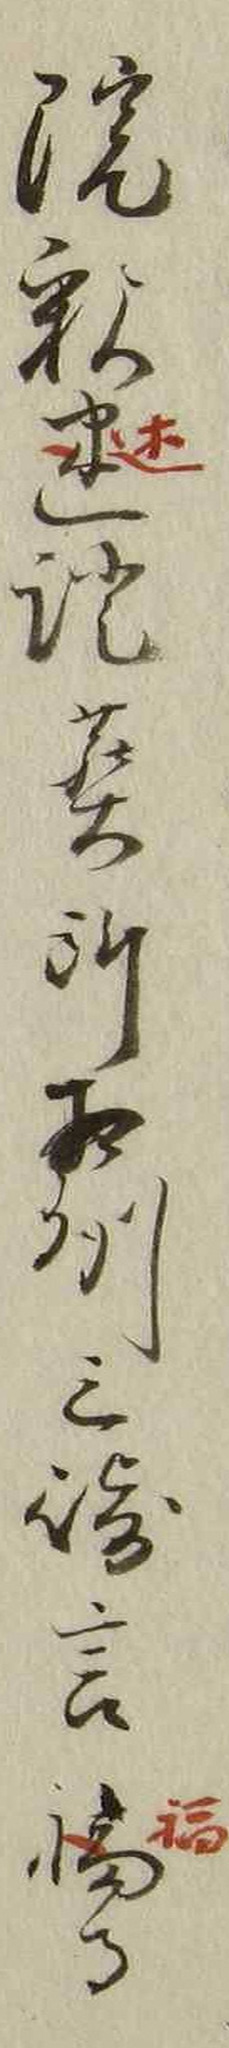院釈述証葬所相州三崎言福寺
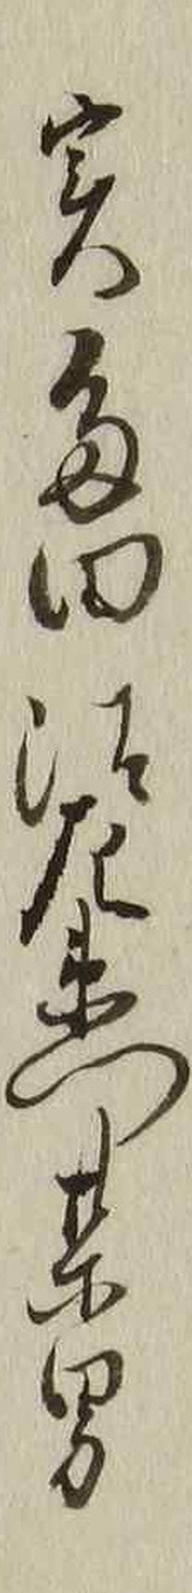実多田清左衛門某男
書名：諸士系譜　巻之129　た之部5
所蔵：会津若松市立会津図書館
